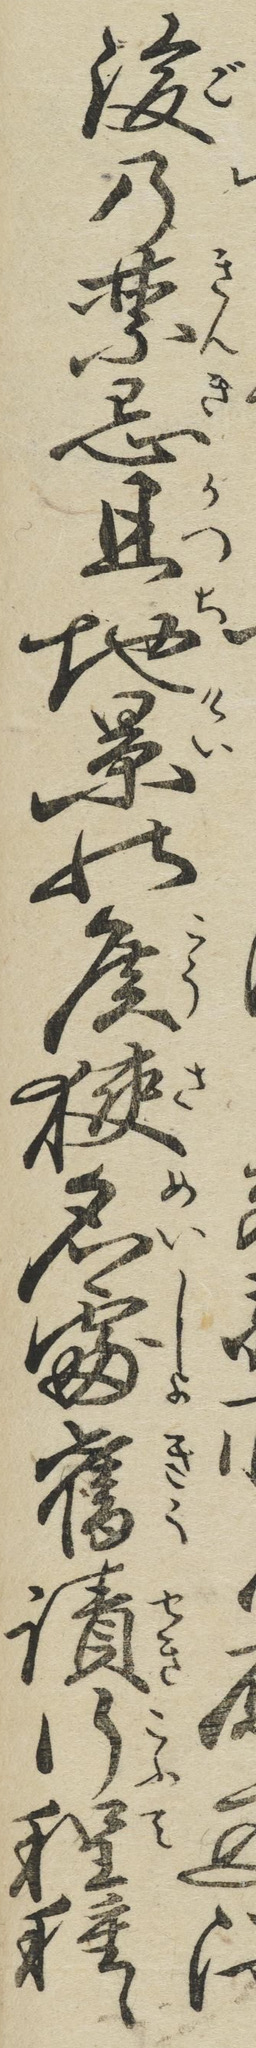後の禁忌且地景の廣狭名處舊蹟行程種々
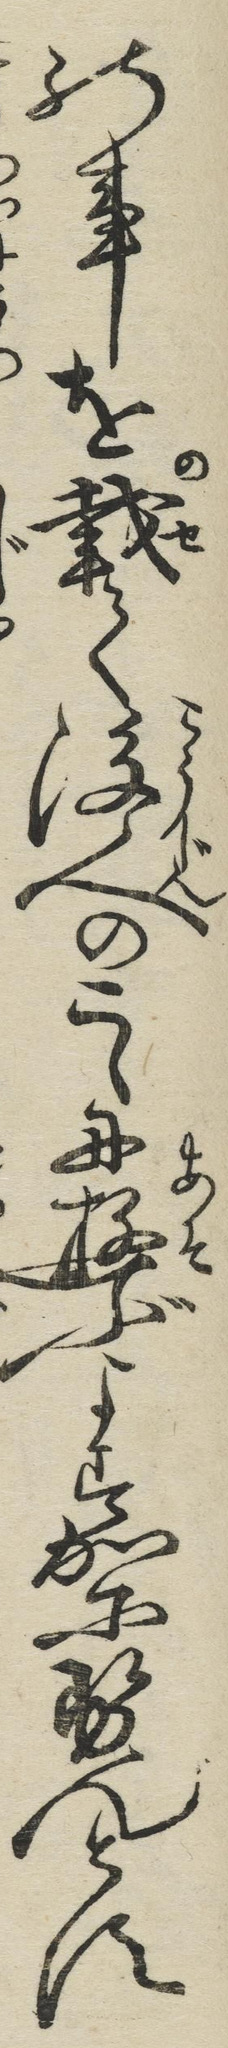の事を載て後人のこゝに遊ぶよすかにせんとす
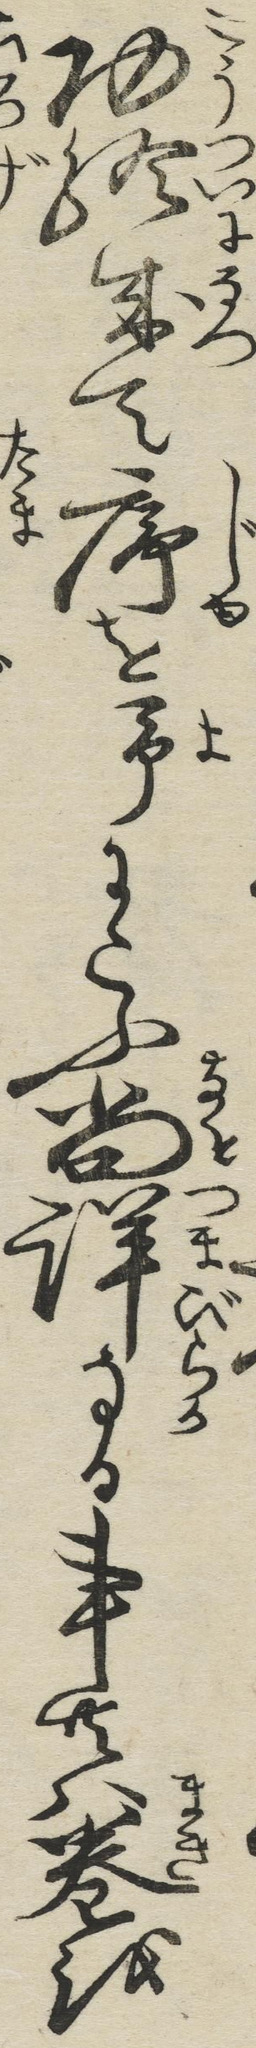功終に成て序を予にこふ尚詳なる事共は巻を
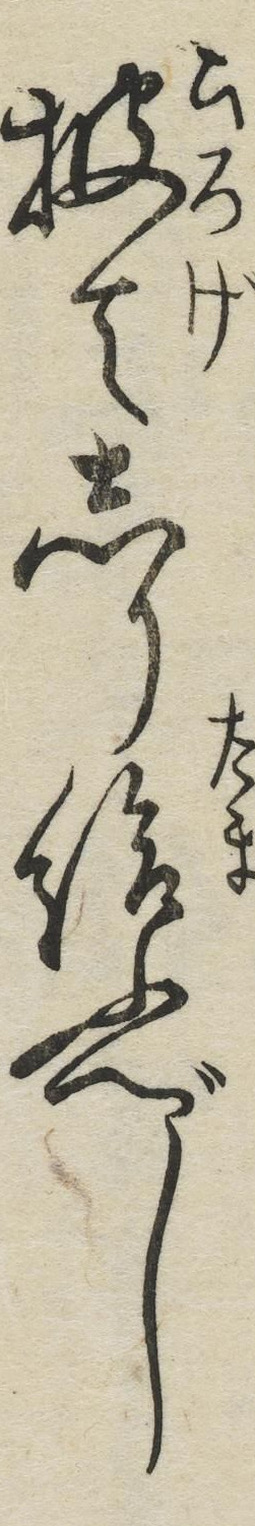披てしり給ふべし
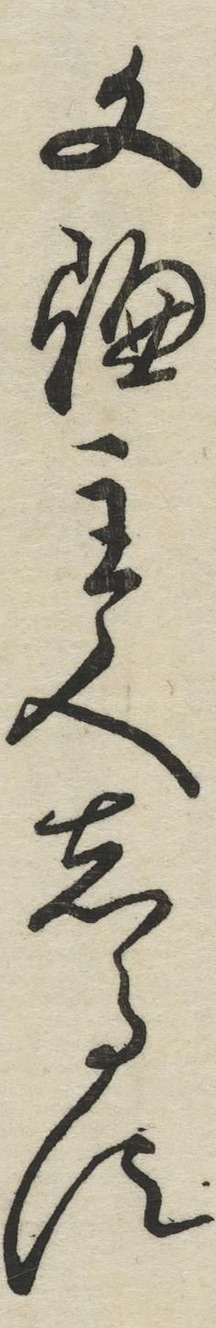文牎主人しるす
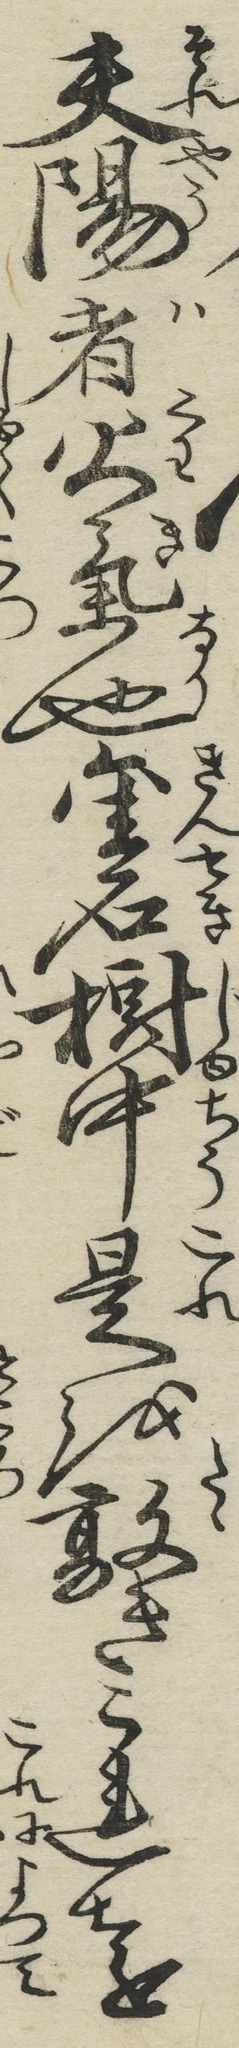夫陽者火氣也金石樹中是を敲きこれを
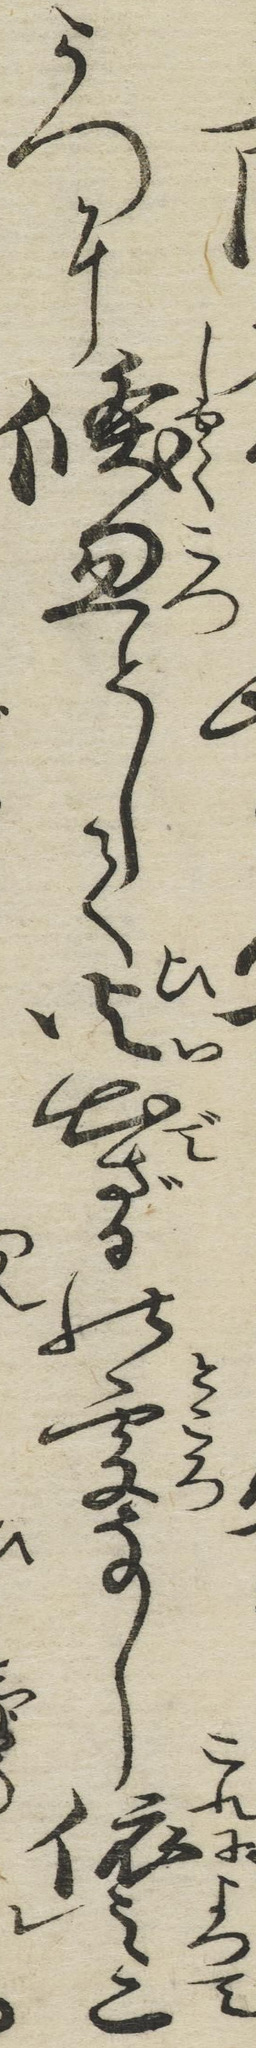うつに倏忽として火出ざるの處なし依之こ
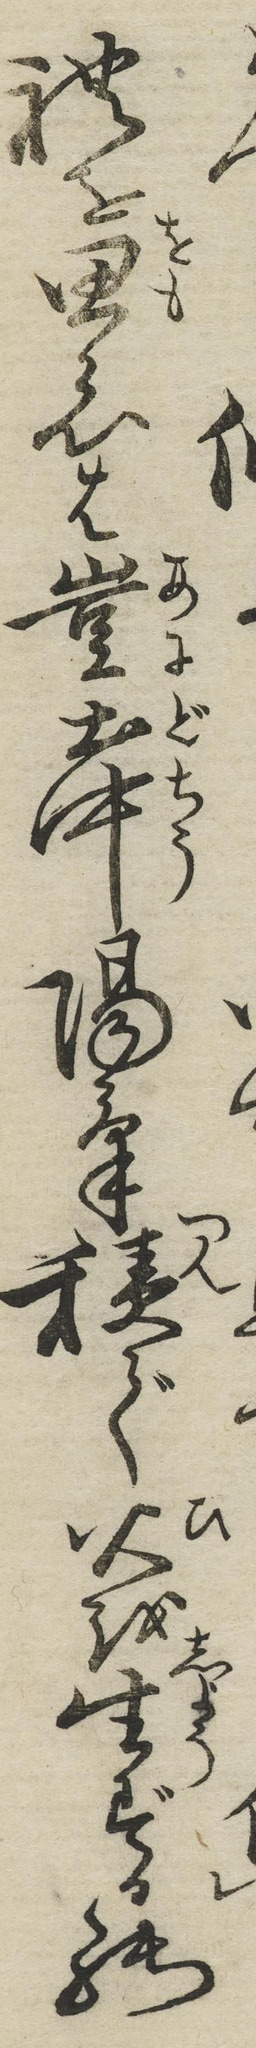れを思えは豈土中陽気積で火を生ずるの

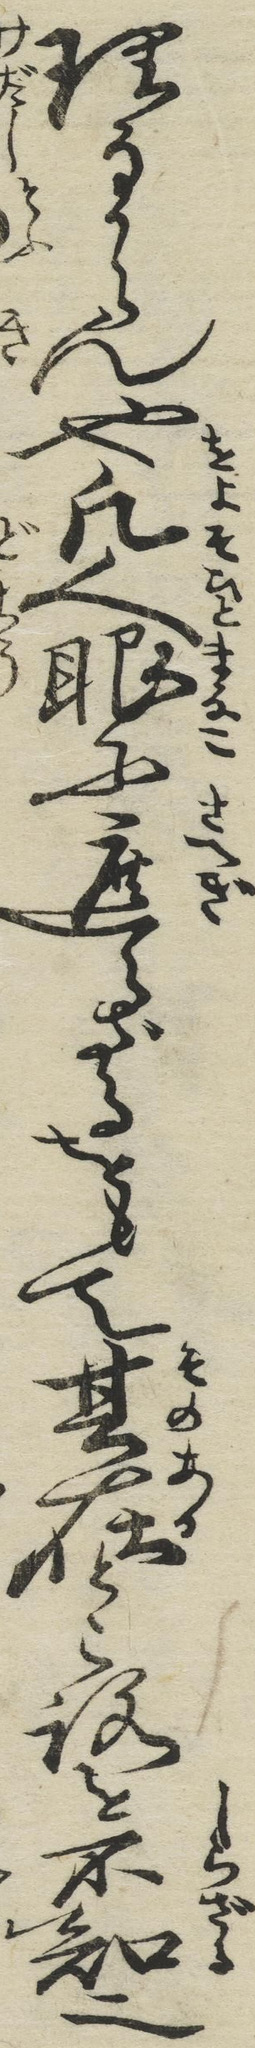理なからんや凢人眼に遮らざるをもて其在ところを不知に
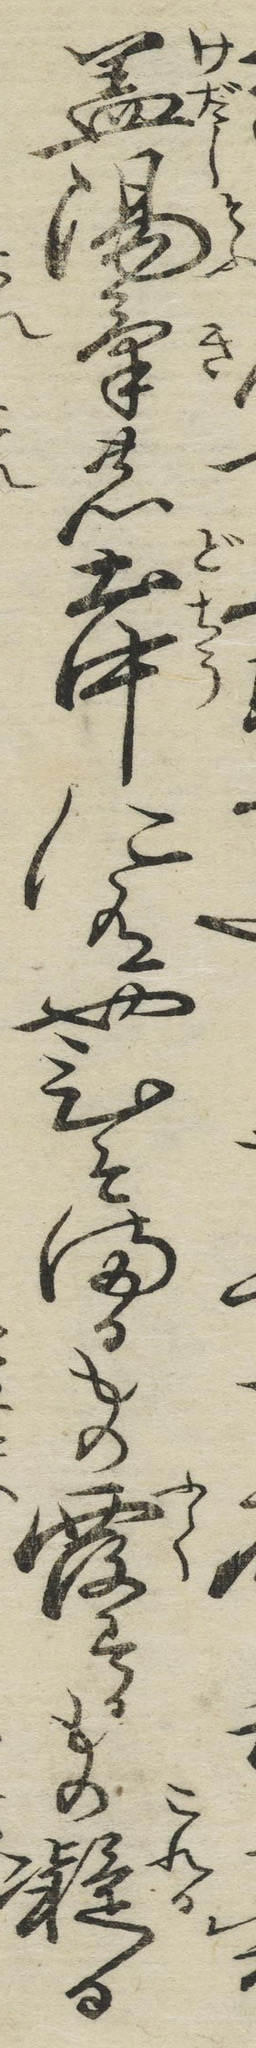蓋湯気の土中に有やひそまるもの覆するもの凝る
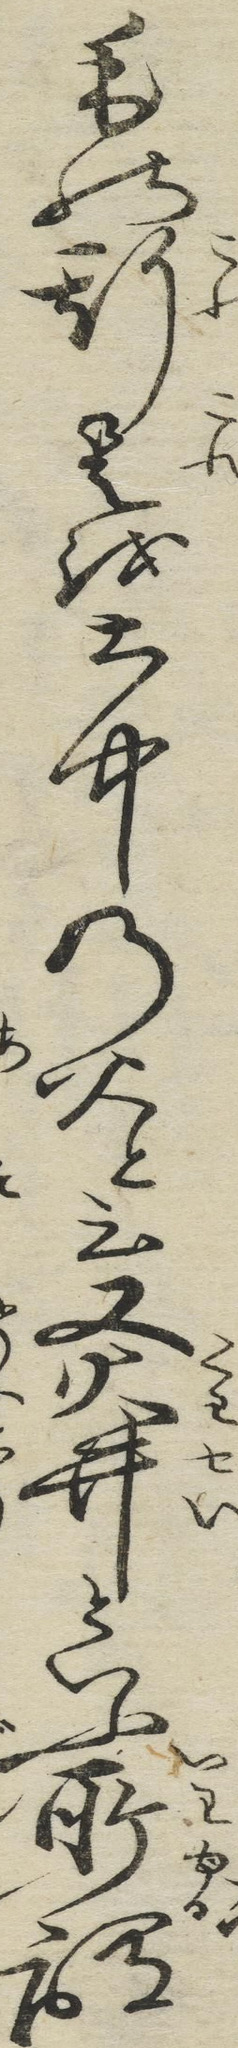もの斯是を土中の火と云又火井といふ所謂
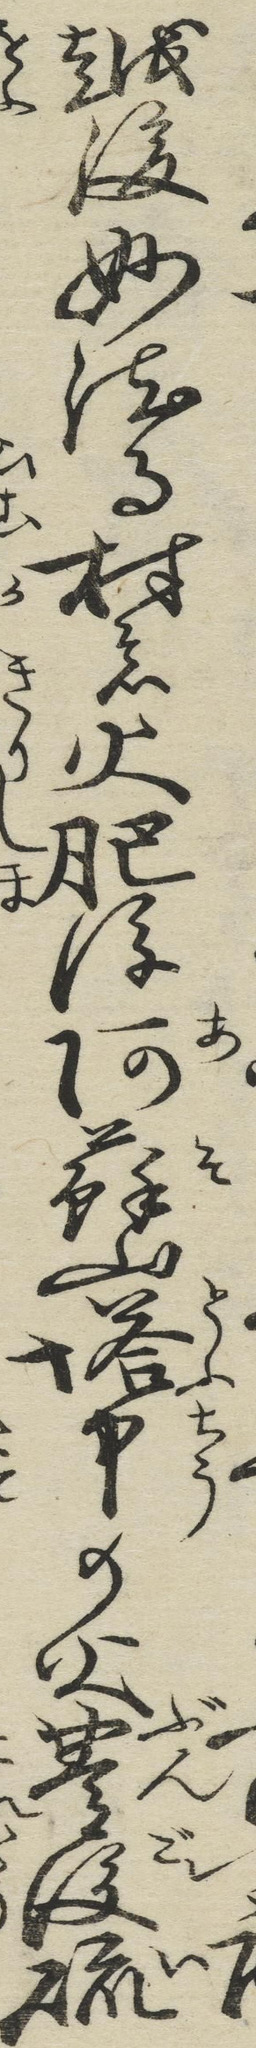越後如法寺村の火肥後阿蘇山塔中の火豊後硫
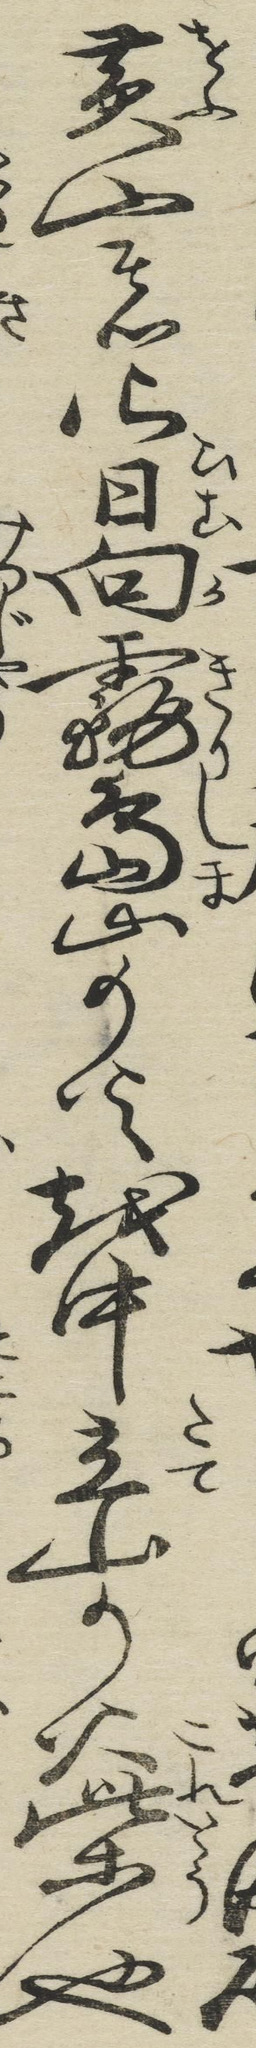黄山の火日向霧島山の火越中立山の火此等や
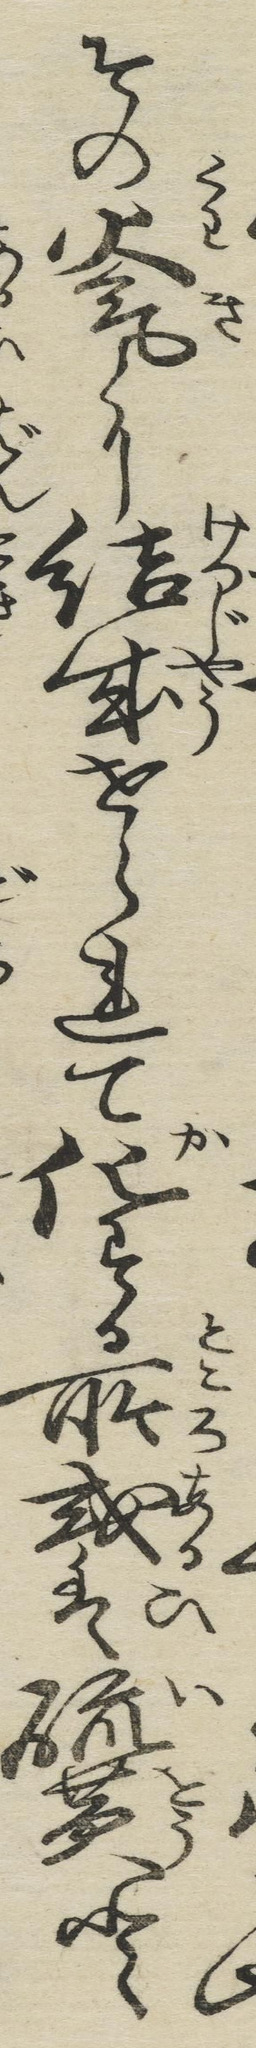その火気とり結成せられて化する所或は硫黄と
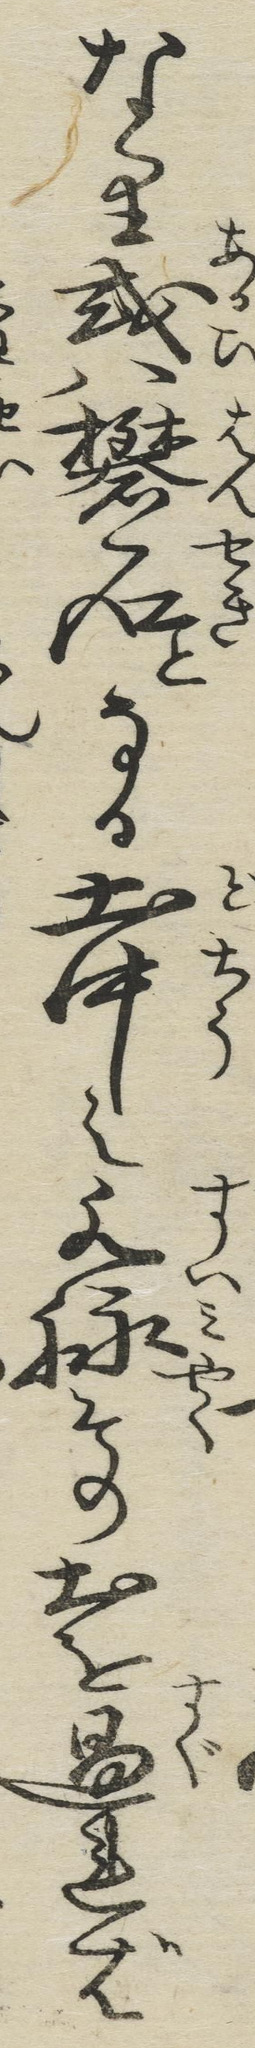なり或は礬石となる土中の水脈その土を過れば
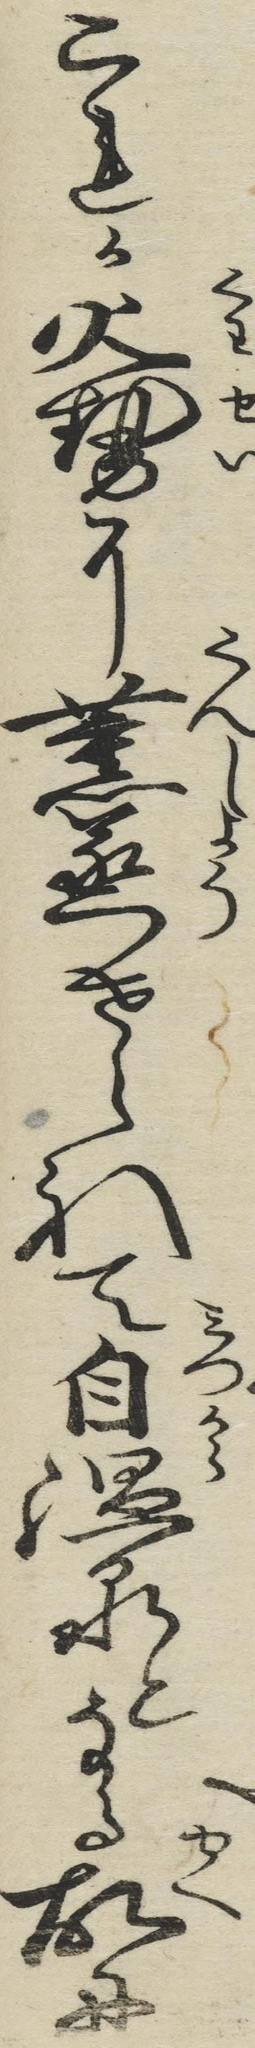これか火勢に薫蒸せられて自温泉となる斯に
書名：箱根七湯　温泉圖會　全
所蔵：東京大学地震研究所図書室 Earthquake Research Institute Library, The University of Tokyo, JAPAN
